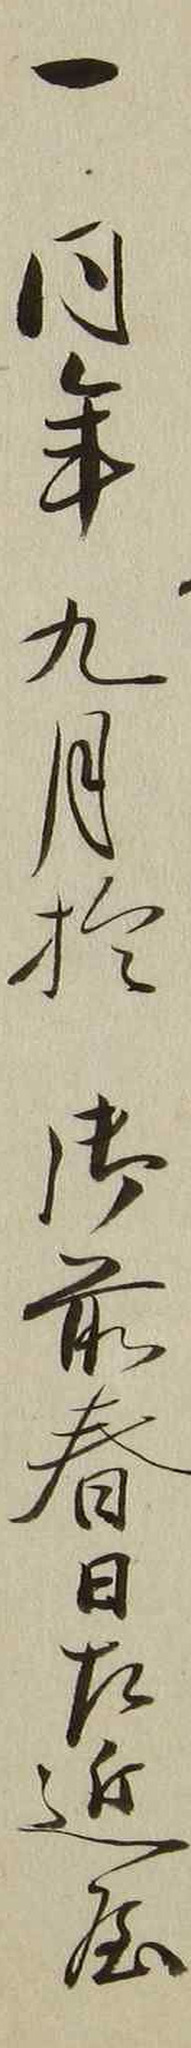一同年九月於御前春日左近屋
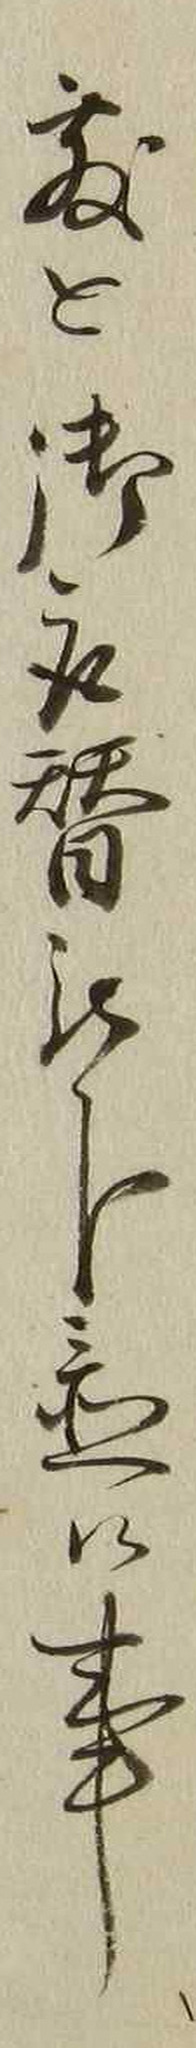敷と御取替被下置候事
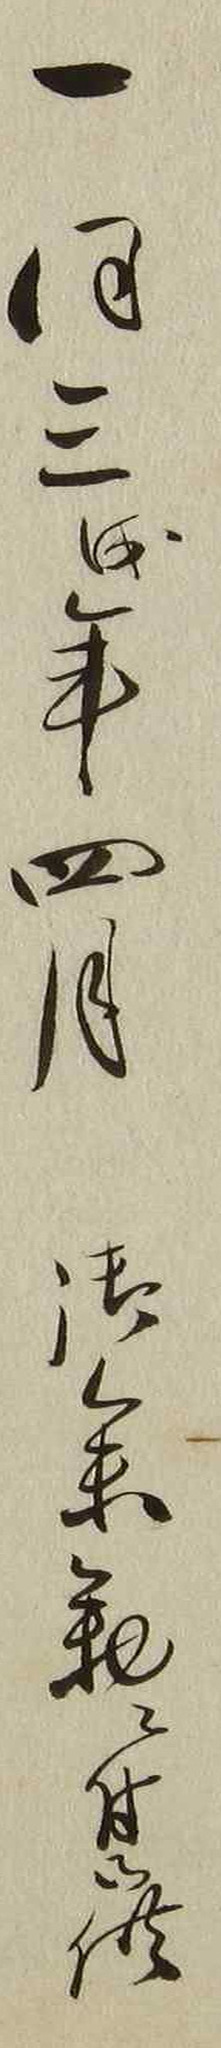一ほ三戌年四月御参勤に付御供
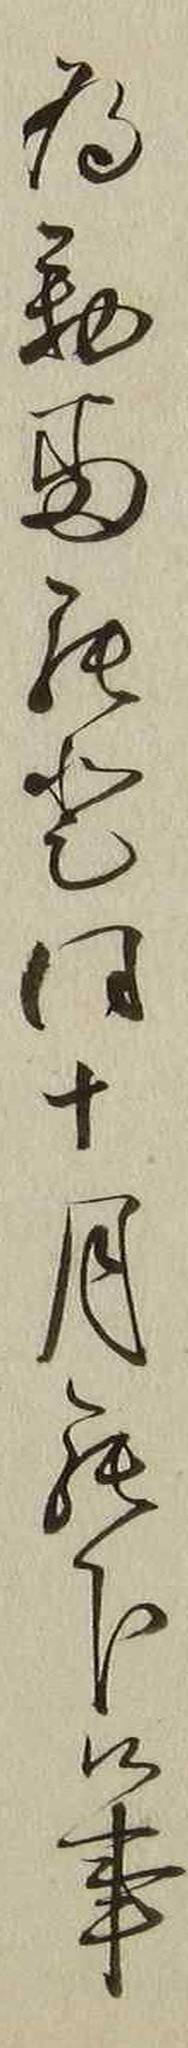為勤番罷登同十月罷下候事
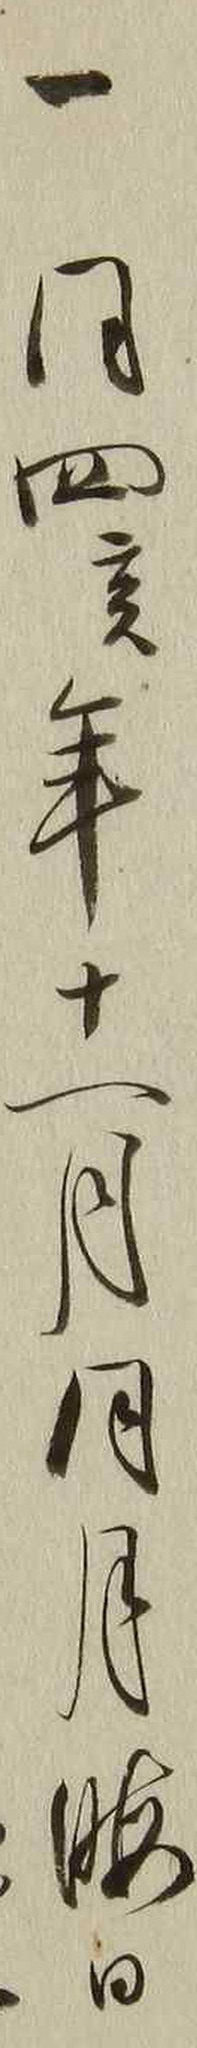一同四亥年十一月同晦日
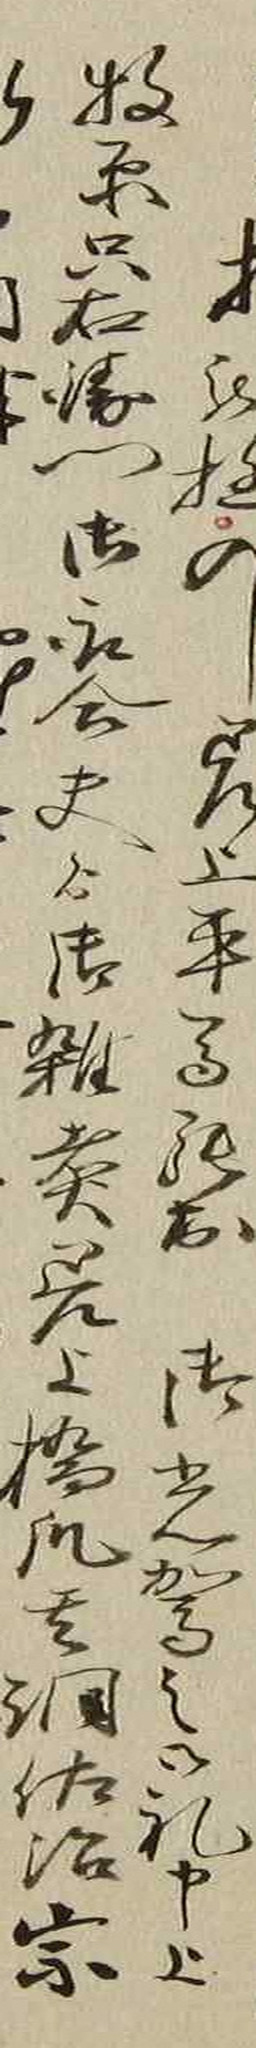牧原只右衛門御取合夫ゟ御雑煮差上橋爪玄調佐治宗
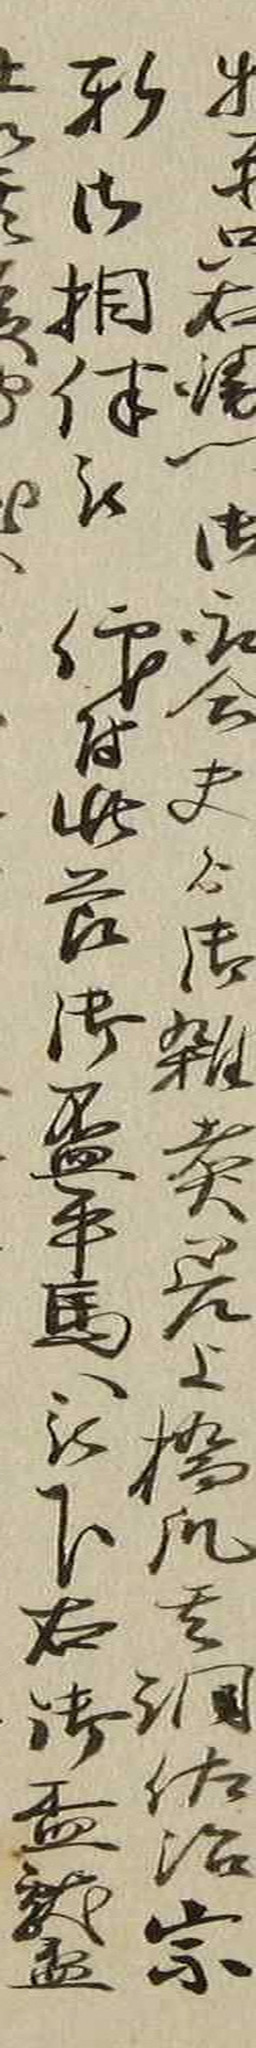軒御相伴被仰付此節御盃平馬へ被下右御盃献杯
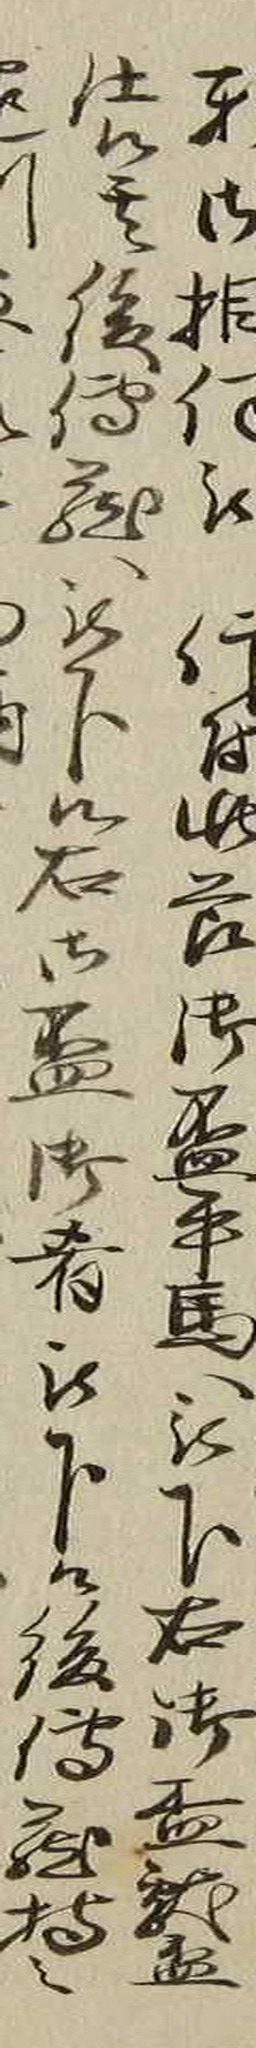仕候其後伝蔵へ被下候右御盃御肴被下候後伝蔵持之
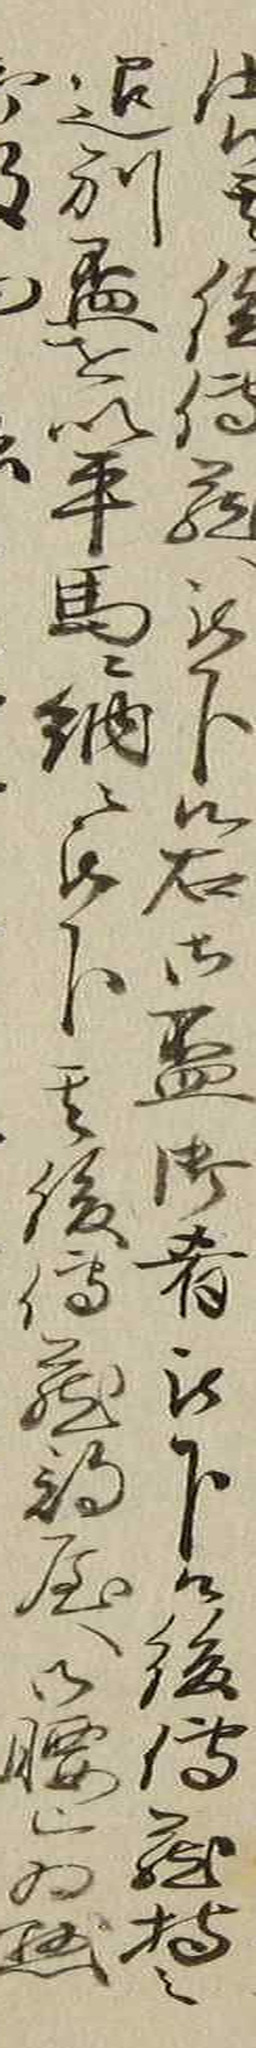退列盃を以平馬に納に被下其後伝蔵部屋へ御腰被為懸
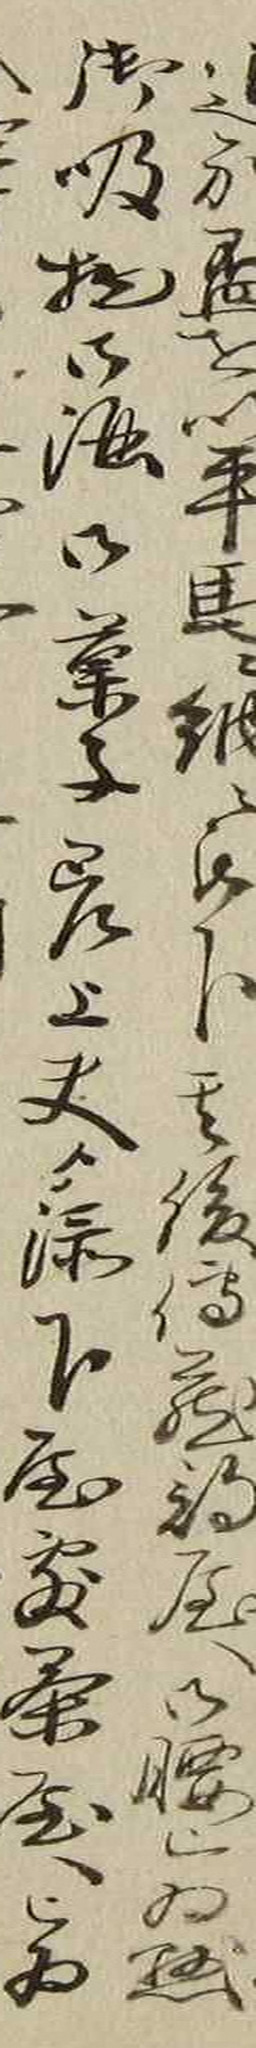御吸物御酒御菓子差上夫ゟ添下屋敷茶屋へ被為
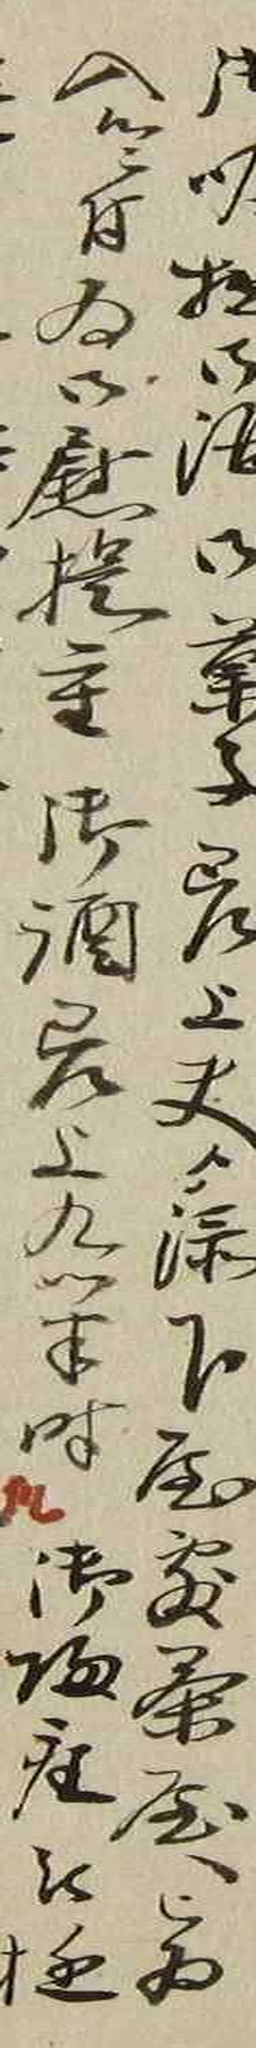入候に付為御慰提重御酒差上九ッ半時御帰座被遊
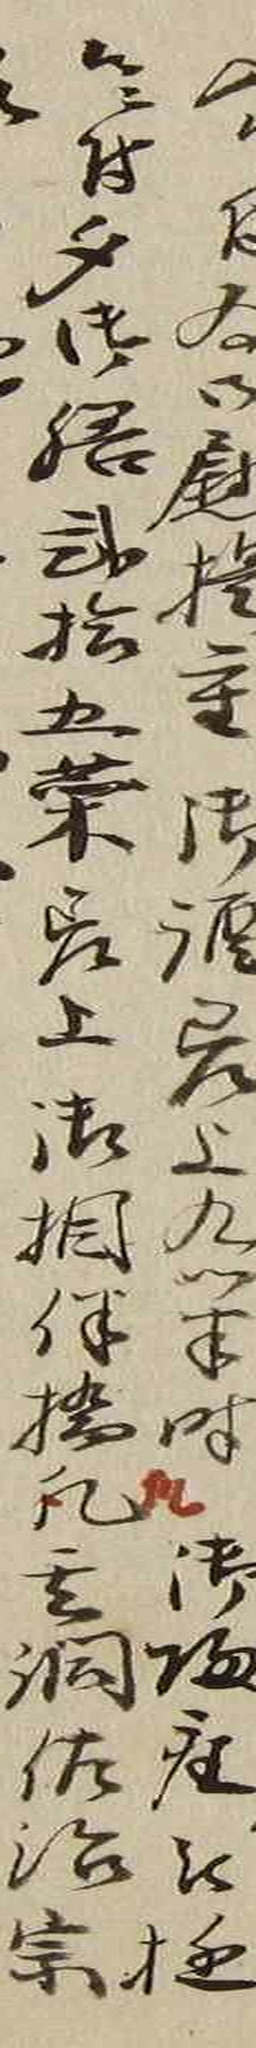候に付夕御膳弐拾五菜差上御相伴橋凡玄調佐治宗
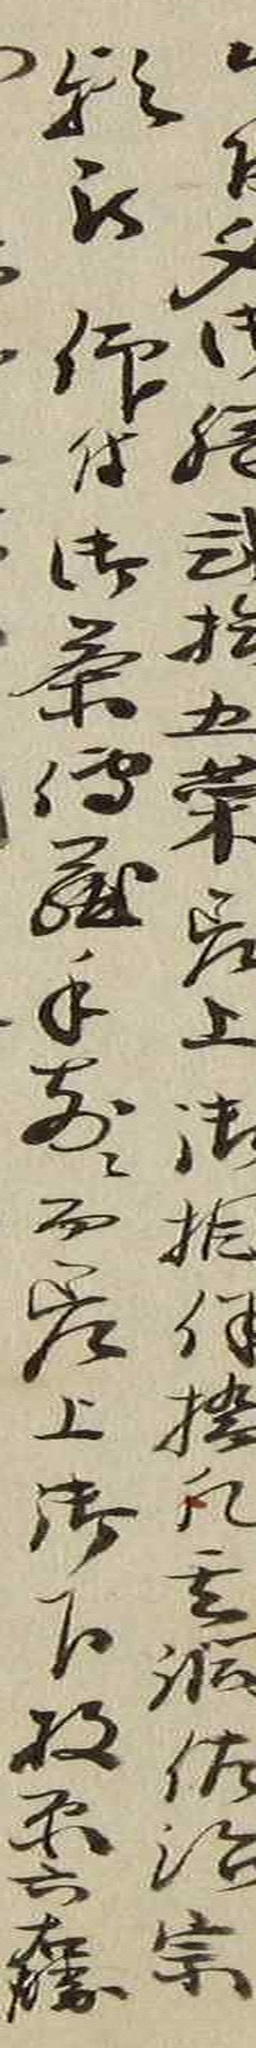軒被仰付御茶伝蔵手前に而差上御下枚原六右衛
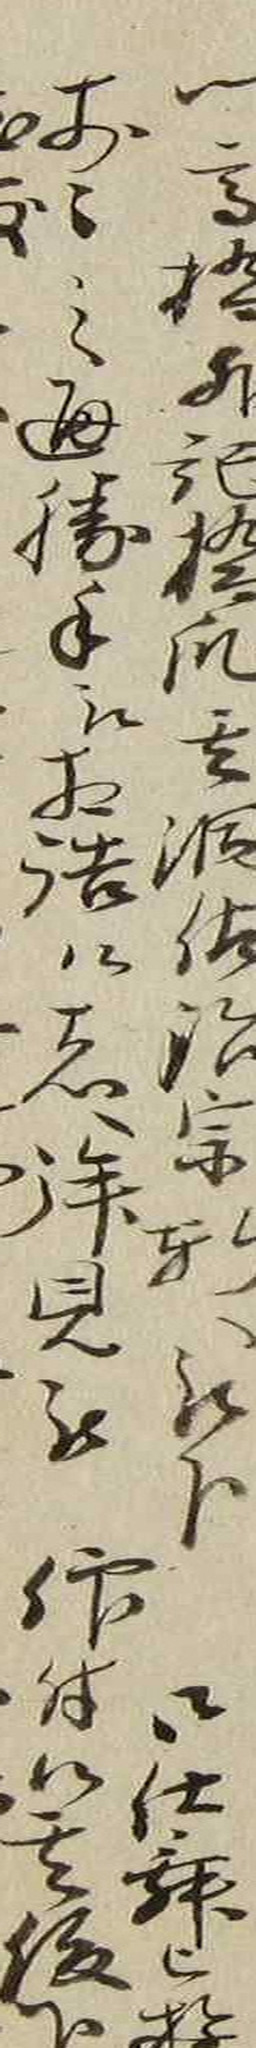前々之通勝手江相詰候者へ拝見被仰付候其後下
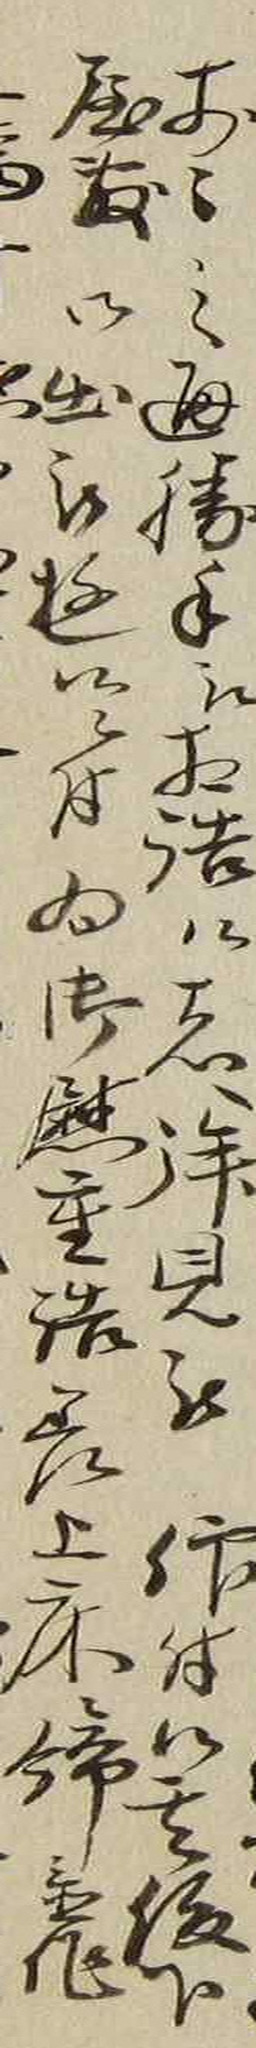屋敷御出被遊候に付為慰重詰差上床飾置作
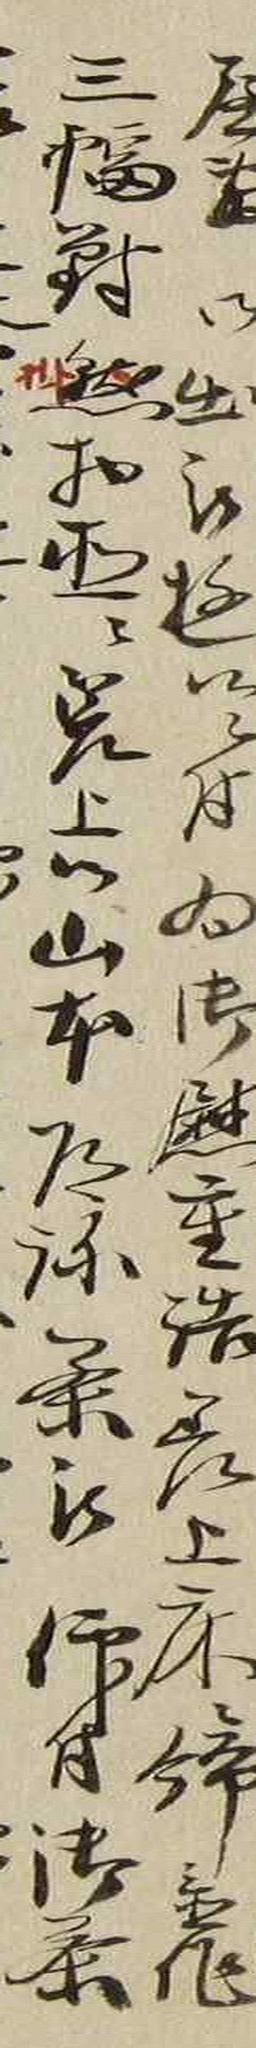三輻対懸物直々差上候山本道弥茶被仰付御茶
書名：諸士系譜　巻之103　か之部11
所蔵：会津若松市立会津図書館
